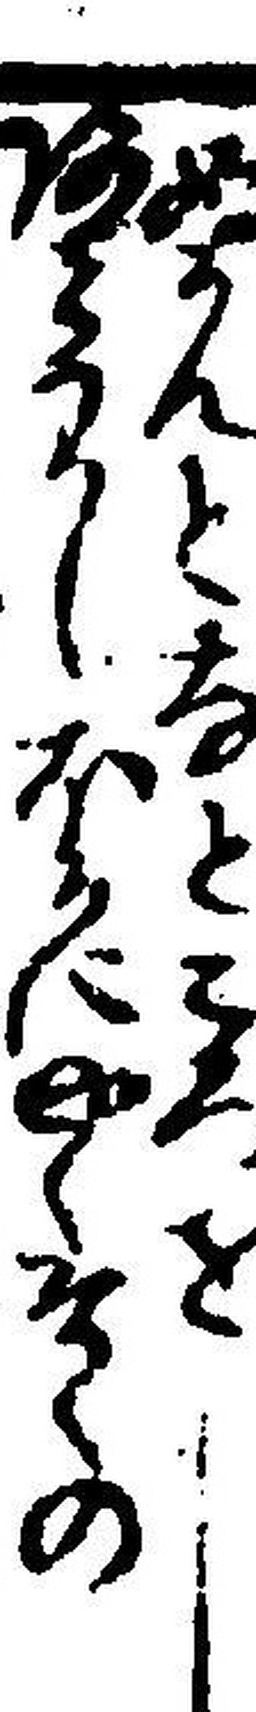あらわしほかにやくそくの
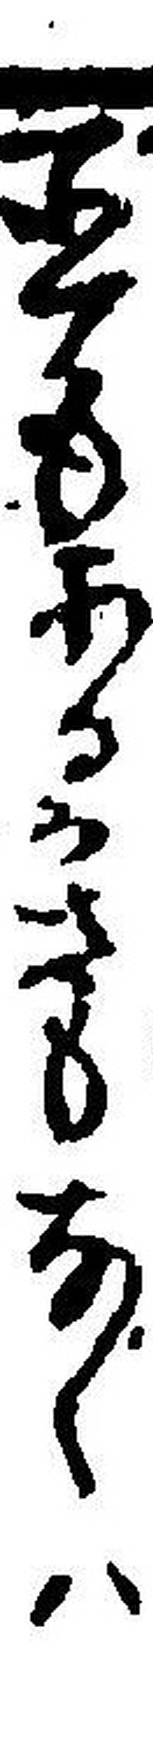所てもあるかさもなくは
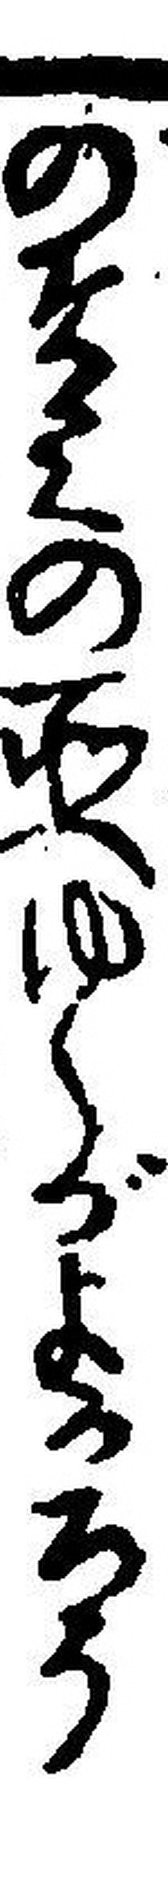のそみの所へゆくがよかろう
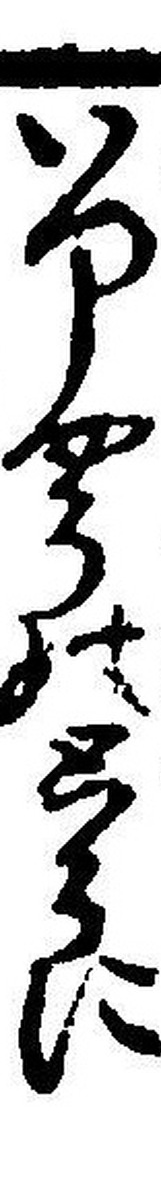いつしやうのとか？に
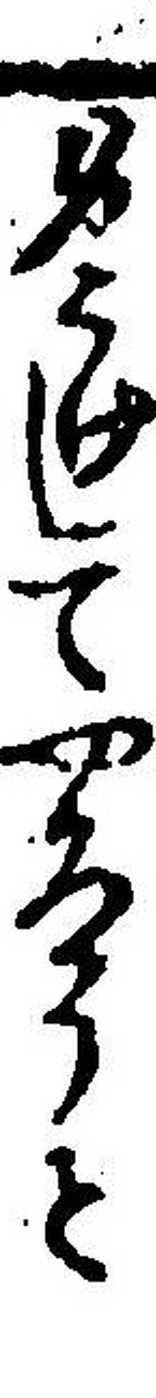身うけしてやろうと
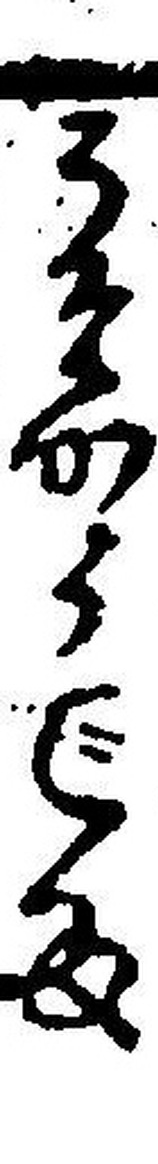うそからでた
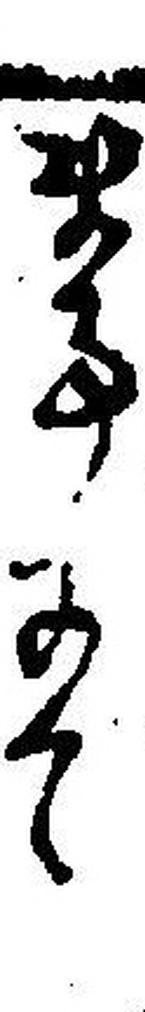ま事にて
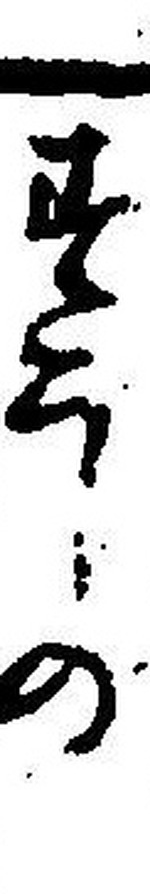すこしの
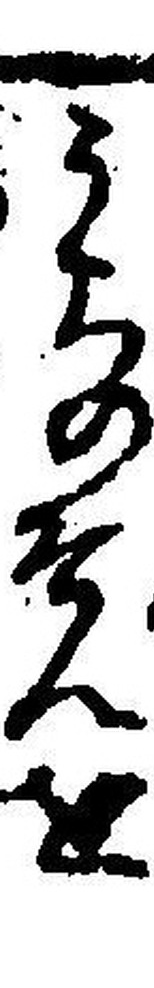うちのそんを
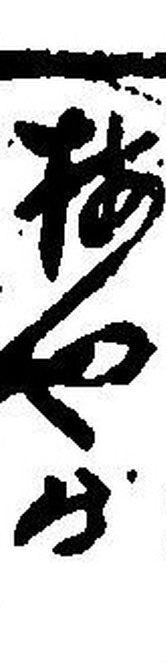梅やが
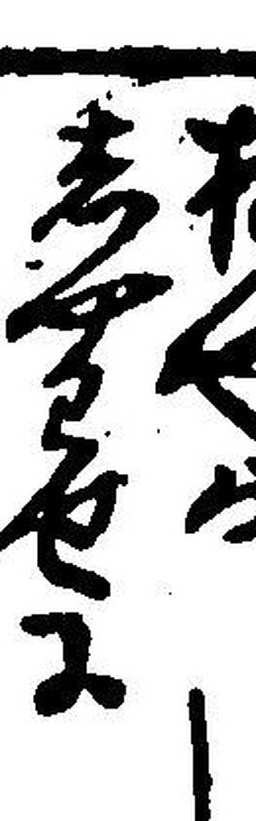しやわせに
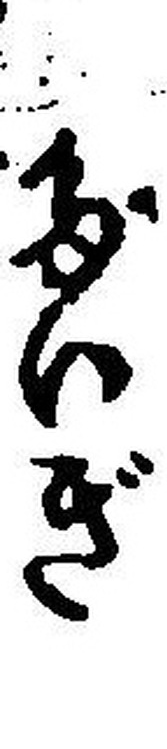たいぎ
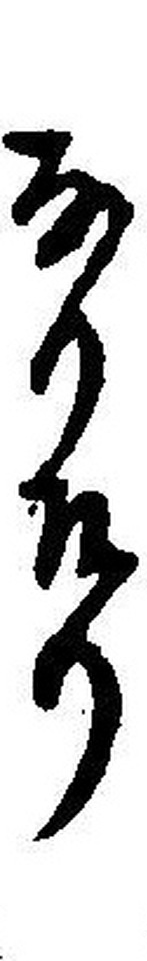なりけり
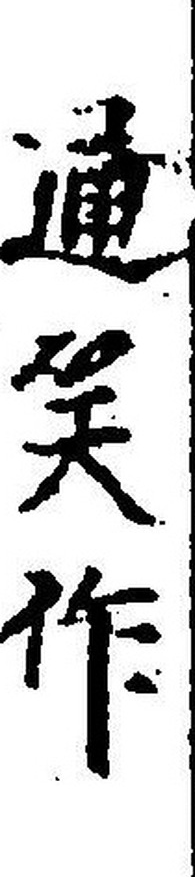通笑作
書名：間違狐之女郎買 / 市場通笑作
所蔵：東京大学総合図書館 General Library in the University of Tokyo, JAPAN
